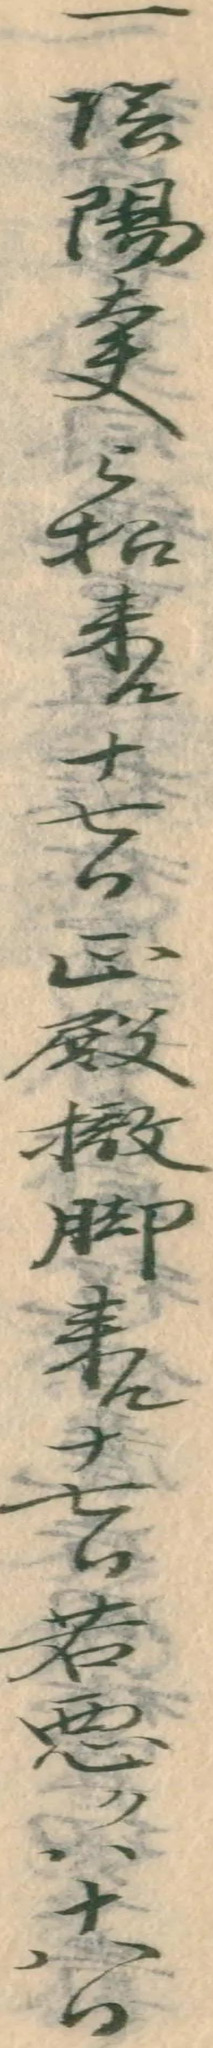一陰陽大夫被招来ル十七日正殿撤脚来ル十七日若悪クハ十八日
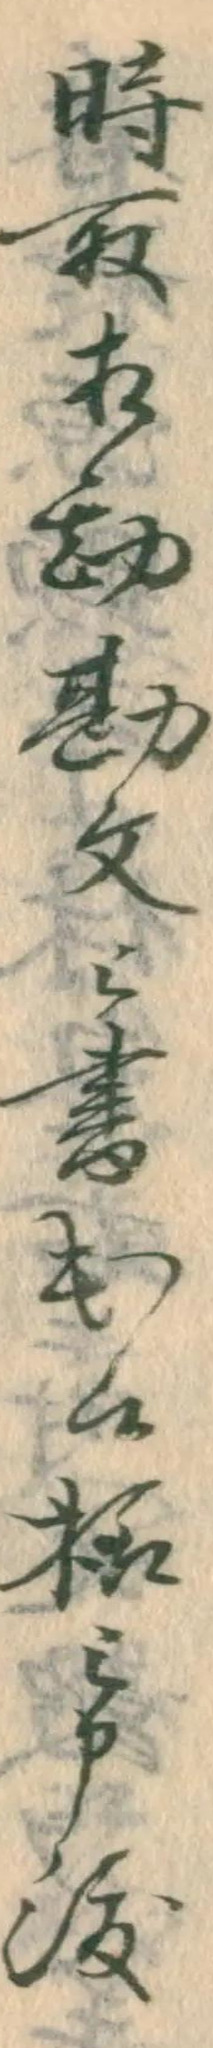時取相勘勘文被書出候様被申渡
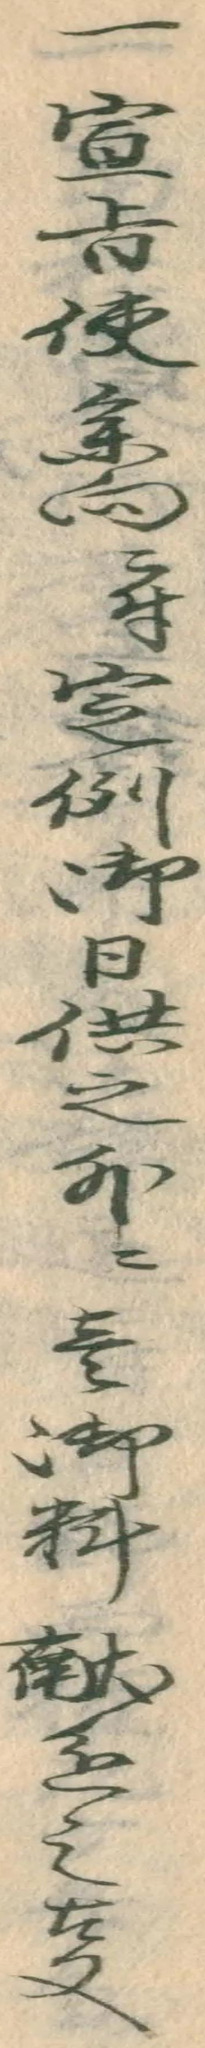一宣旨使参向ニ付定例御日供之外ニ壱御料献進之事
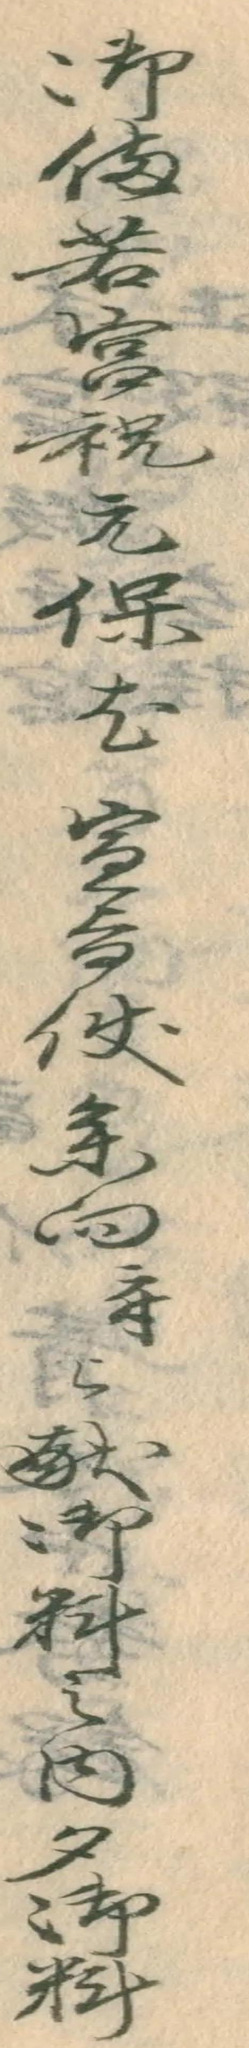御備若宮祝元保尤宣旨使参向ニ付被献御料之内夕御料
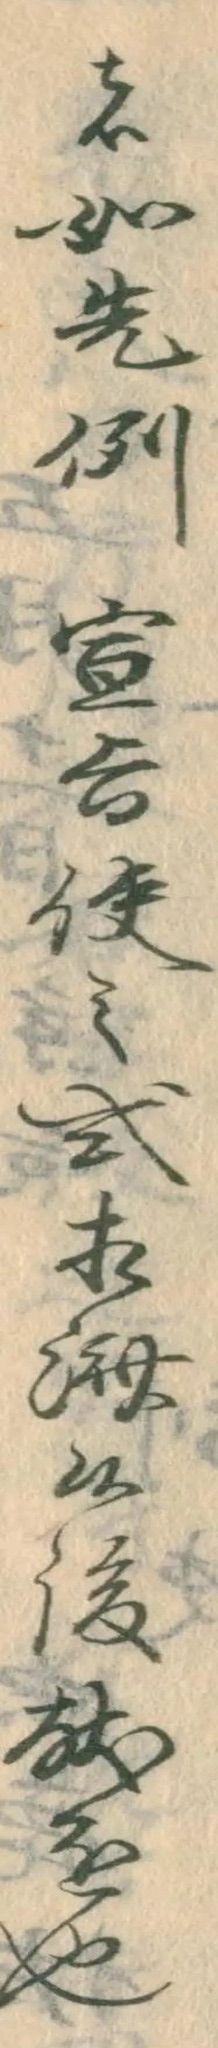は如先例宣旨使之式相済候後献通也
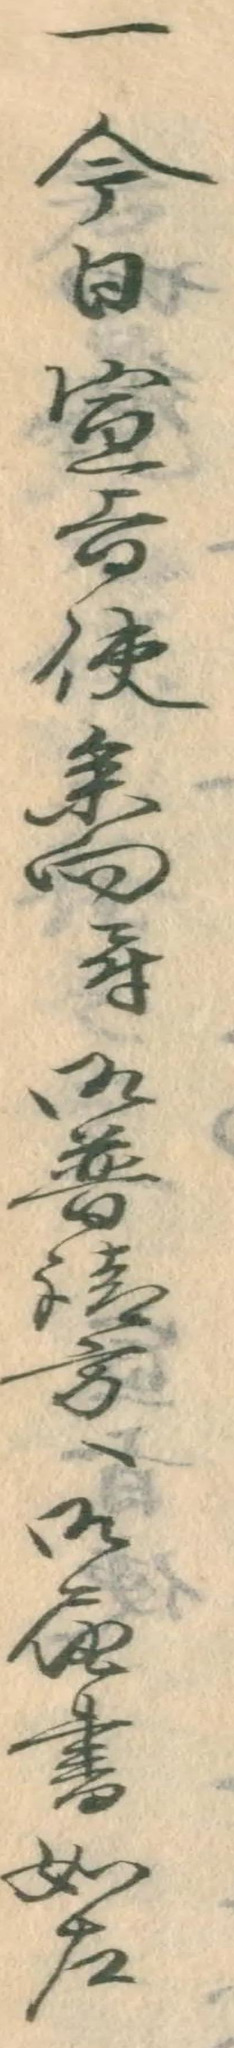一今日宣旨使参向ニ付御普請方へ御届書如左

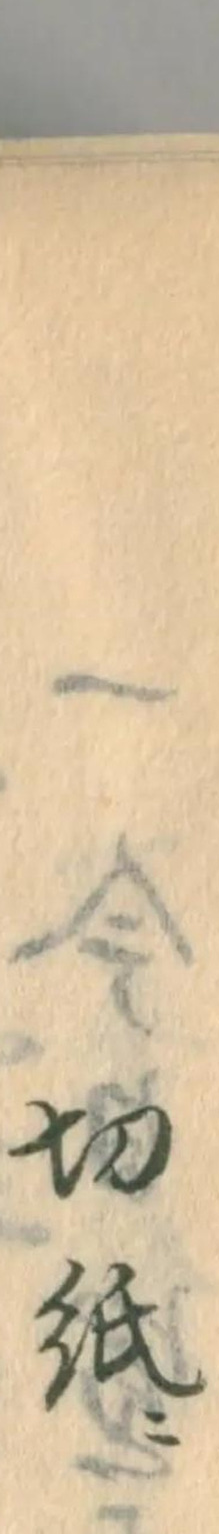切紙ニ
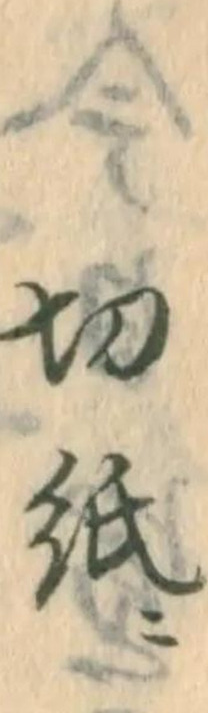切紙ニ
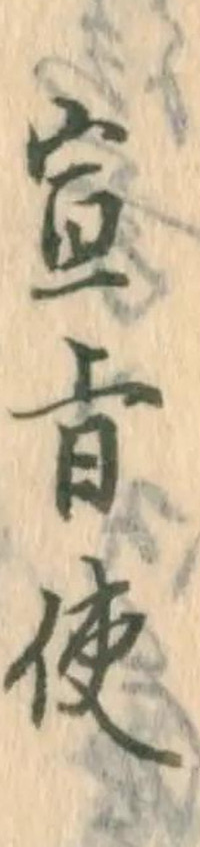宣旨使
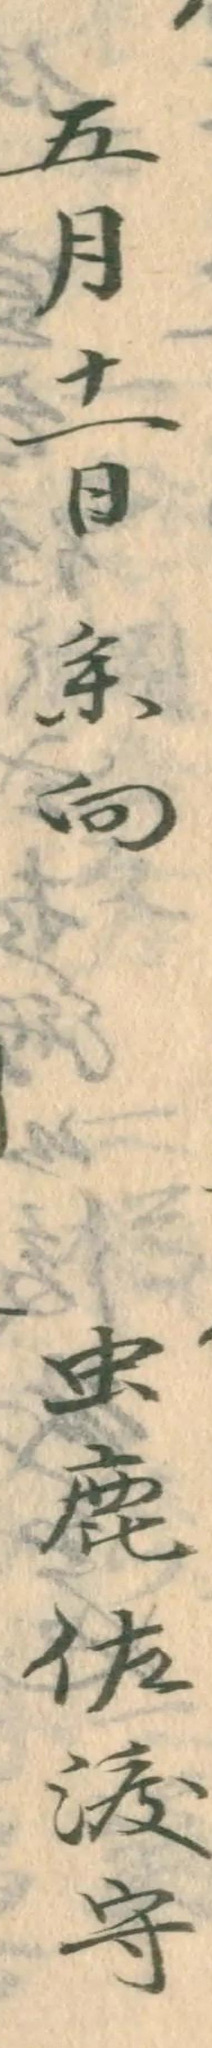五月十一日参向虫鹿佐渡守
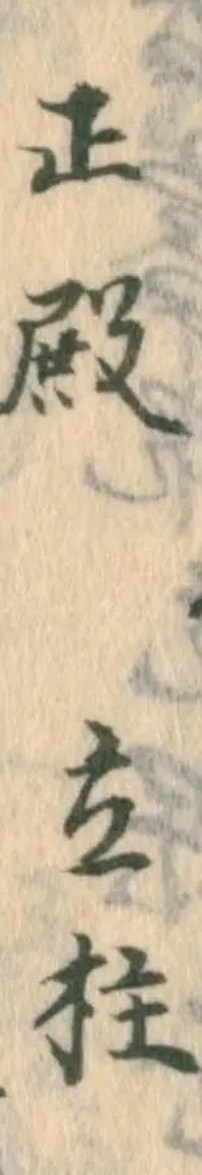正殿立柱
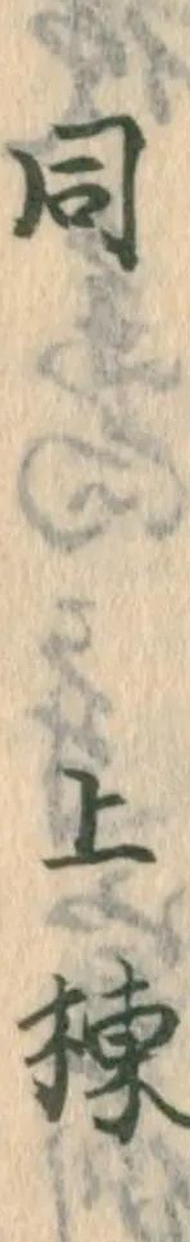同上棟
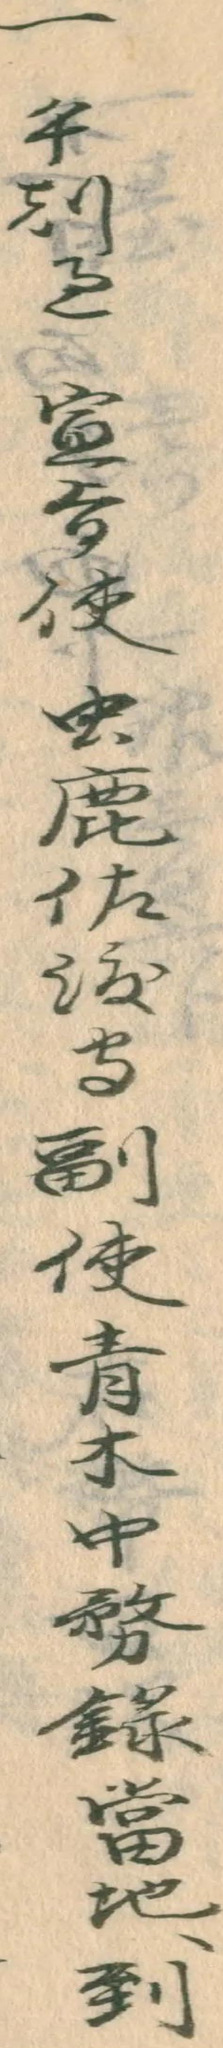一午刻過宣旨使虫鹿佐渡守副使青木中務録当地へ到
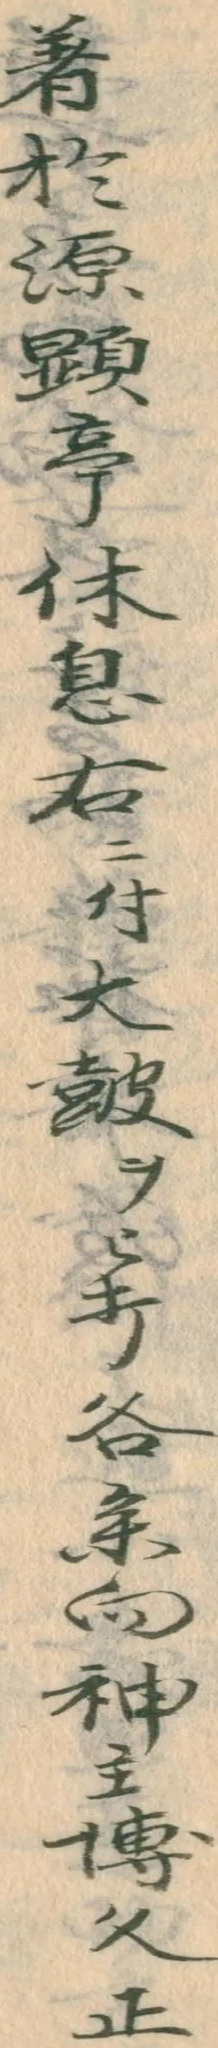着於源顕亭休息右ニ付大鼓ヲ被打各参向神主博久正
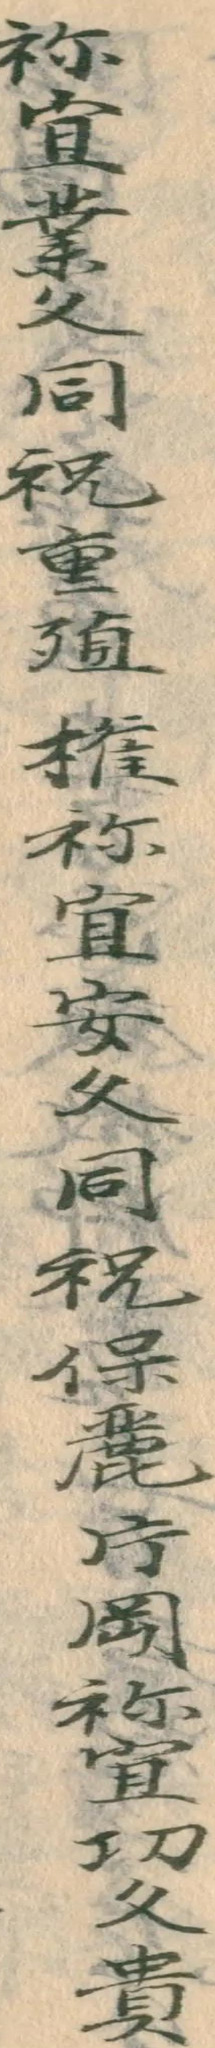祢宜業久同祝重殖権祢宜安久同祝保麗片岡祢宜功久貴
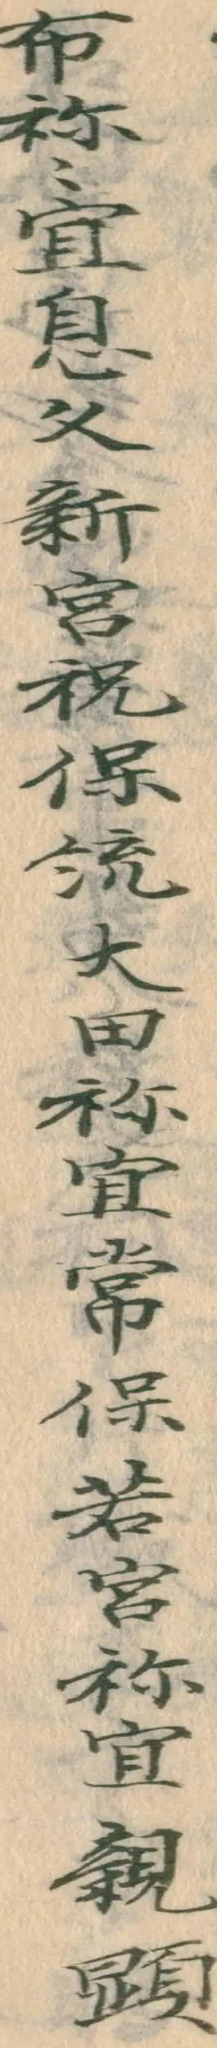布祢々宜息久新宮祝保統大田祢宜常保若宮祢宜親顕
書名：賀茂社記録. 第17冊
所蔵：国立国会図書館 National Diet Library, JAPAN
